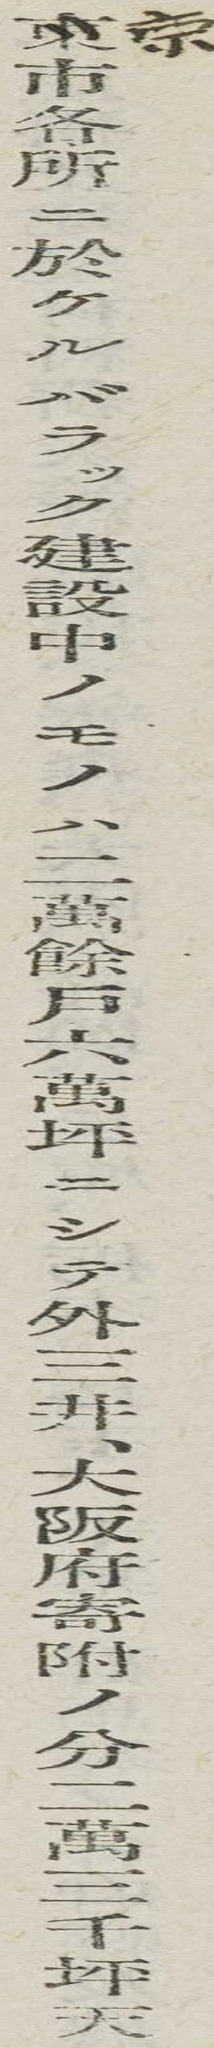京市各所ニ於ケルバラック建設中ノモノハニ万余戸六万坪ニシテ外三井、大阪府寄附ノ分ニ万三千坪天
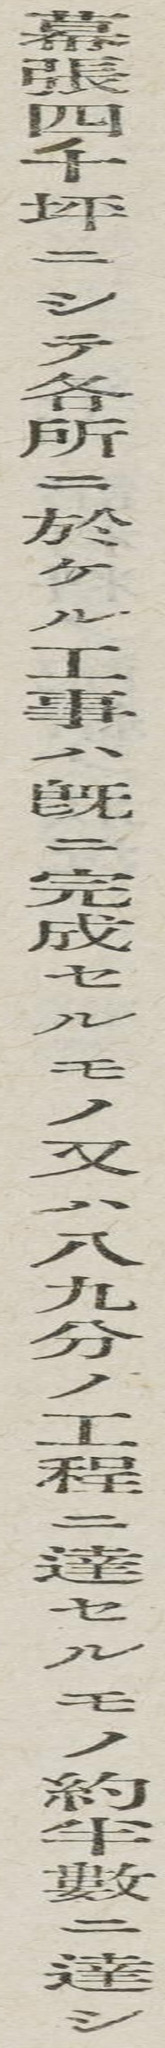幕張四千坪ニシテ各所ニ於ケル工事ハ既ニ完成セルモノ又ハ八九分ノ工程ニ達セルモノ約半数ニ達シ
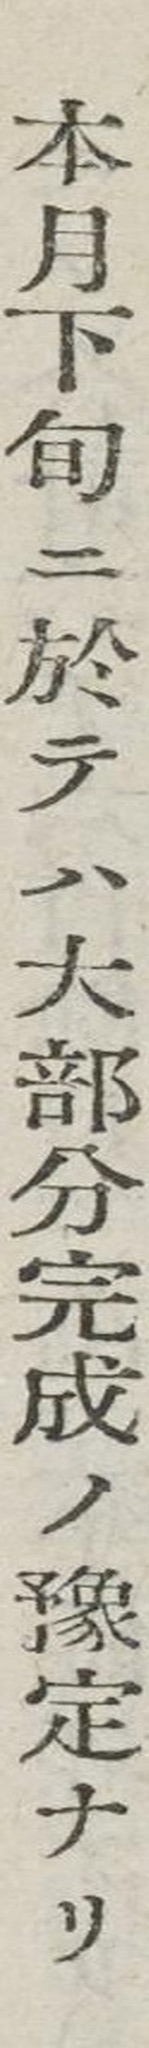本月下旬ニ於テハ大部分完成ノ予定ナリ
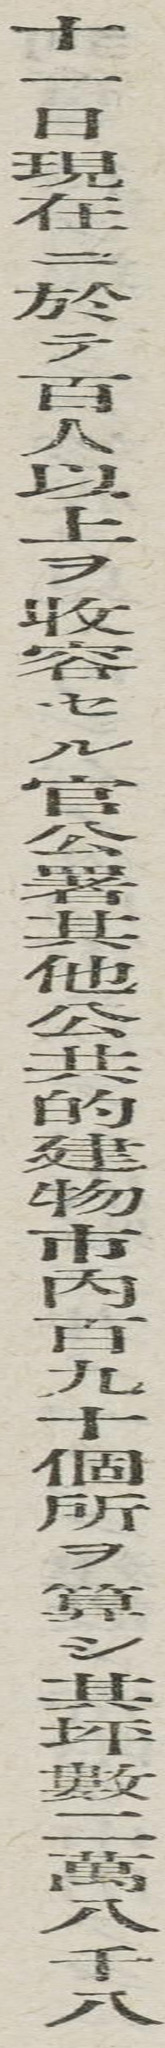十一日現在ニ於テ百人以上ヲ収容セル官公署其他公共的建物市内百九十箇所ヲ算シ其坪数ニ万八千八
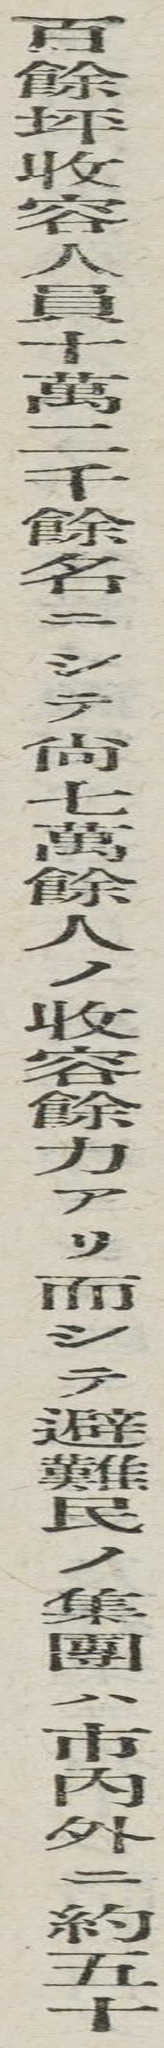百余坪収容人員十万二千余名ニシテ尚七万余人ノ収容余力アリ而シテ避難民ノ集団ハ市内外ニ約五十
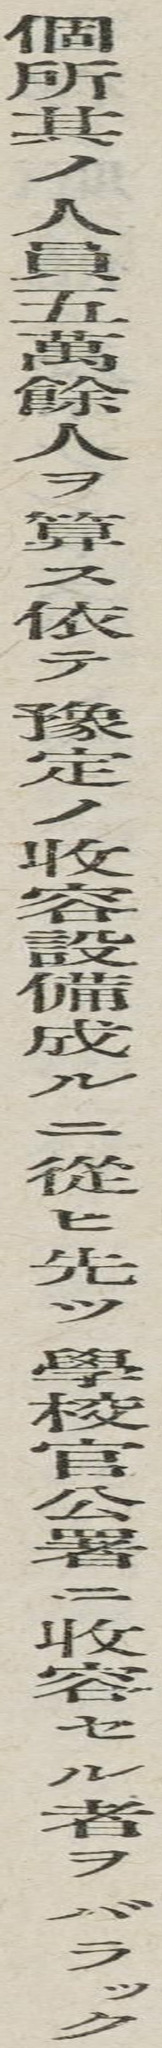箇所其ノ人員五万余人ヲ算ス依テ予定ノ収容設備成ルニ従ヒ先ツ学校官公署ニ収容セル者ヲバラック

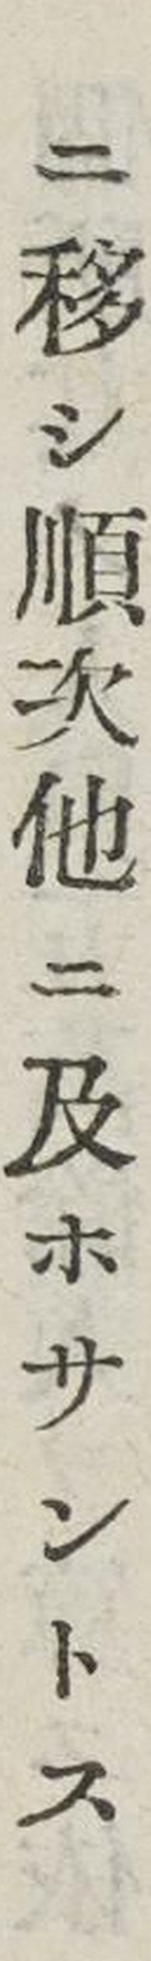ニ移シ順次他ニ及ホサントス
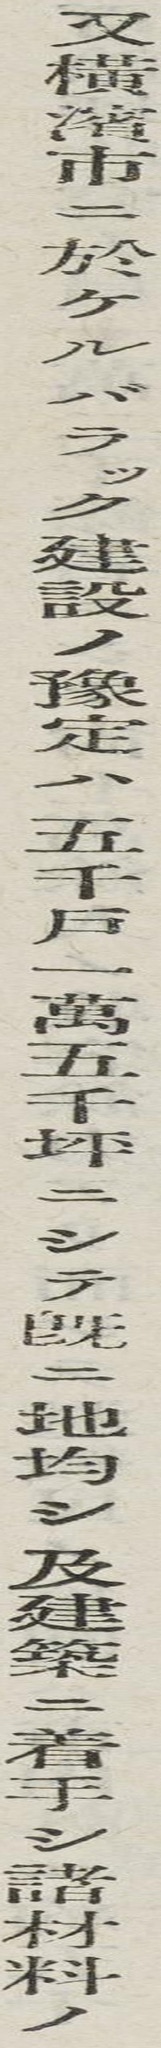又横浜市ニ於ケルバラック建設ノ予定ハ五千戸一万五千坪ニシテ既ニ地均シ及建築ニ着手シ諸材料ノ
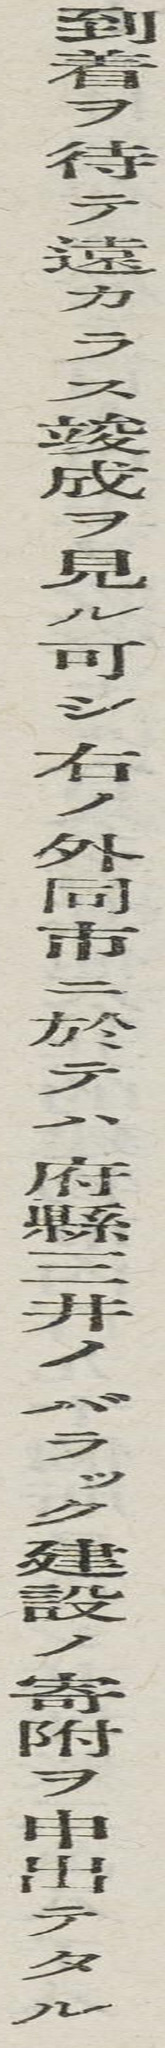到着ヲ待テ遠カラス竣成ヲ見ル可シ右ノ外同市ニ於テハ府県三井ノバラック建設ノ寄附ヲ申出テタル
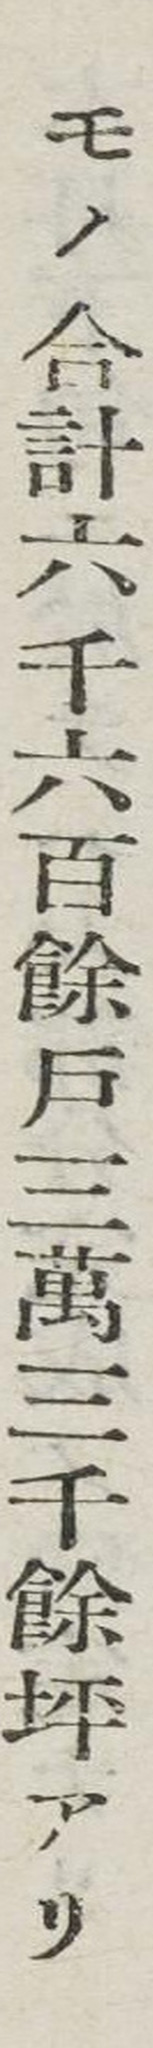モノ合計六千六百余戸三万三千余坪アリ
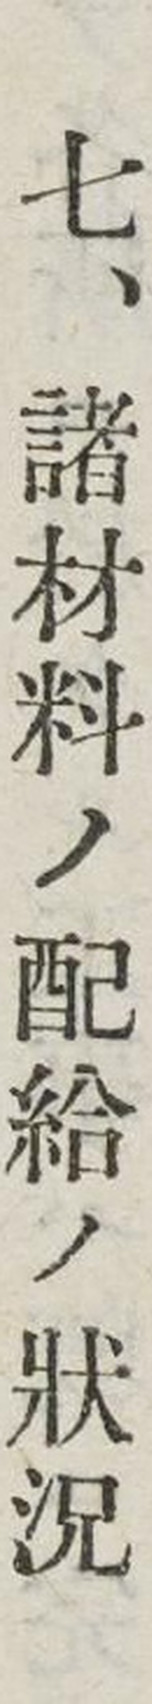七、諸材料ノ配給ノ状況
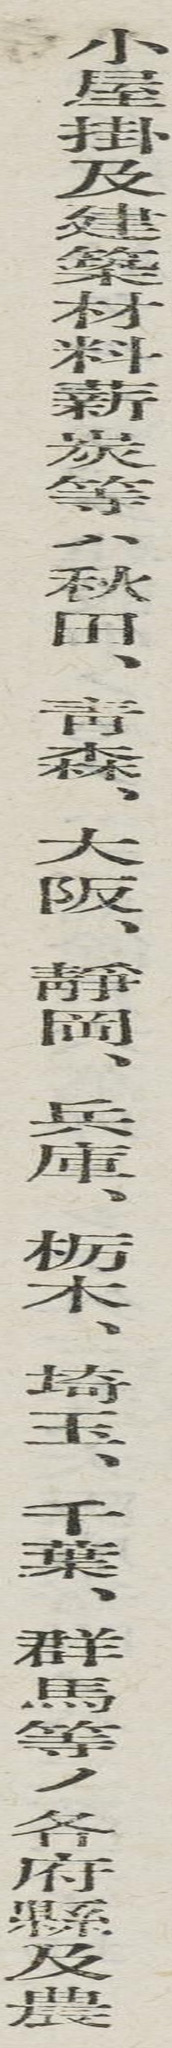小屋掛及建築材料薪炭等ハ秋田、青森、大阪、静岡、兵庫、栃木、埼玉、千葉、群馬等ノ各府県及農
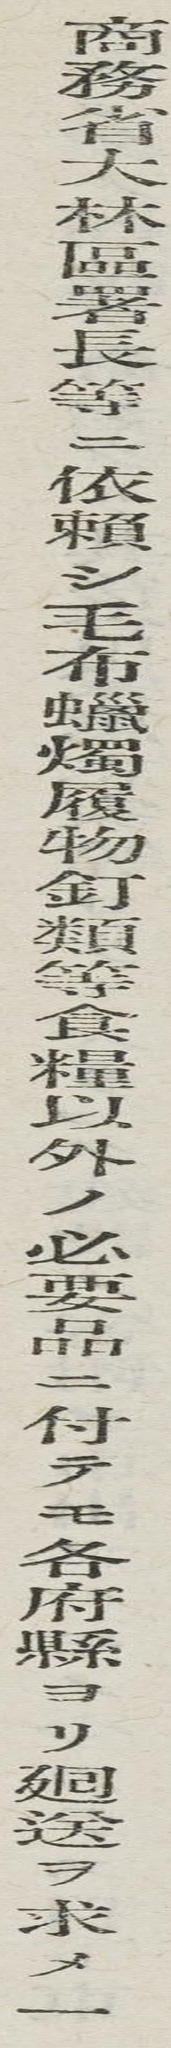商務省大林区署長等ニ依頼シ毛布蝋燭履物釘類等食糧以外ノ必要品ニ付テモ各府県ヨリ廻送ヲ求メ一
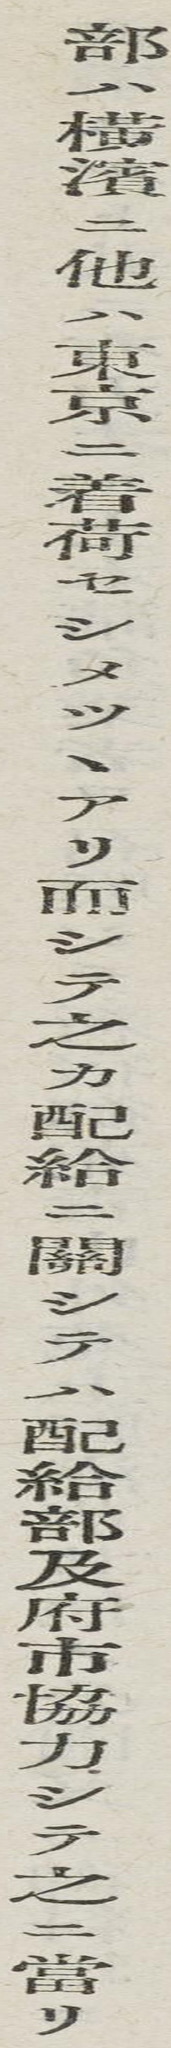部ハ横浜ニ他ハ東京ニ着荷セシメツヽアリ而シテ之カ配給ニ関シテハ配給部及府市協力シテ之ニ当リ
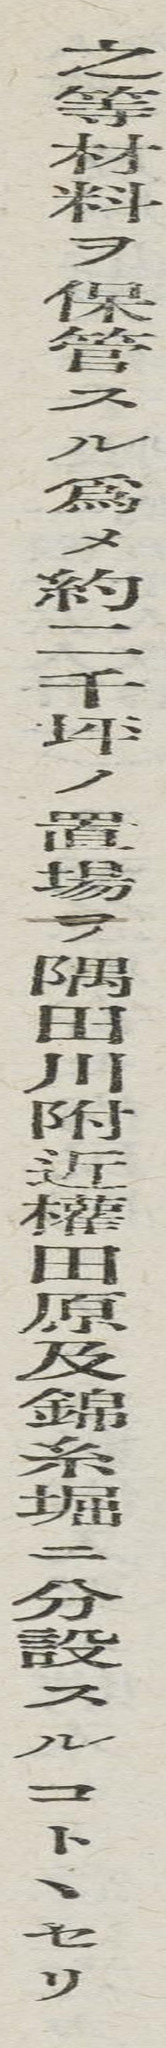之等材料ヲ保管スル為メ約二千坪ノ置場ヲ隅田川附近権田原及錦糸堀ニ分設スルコトヽセリ
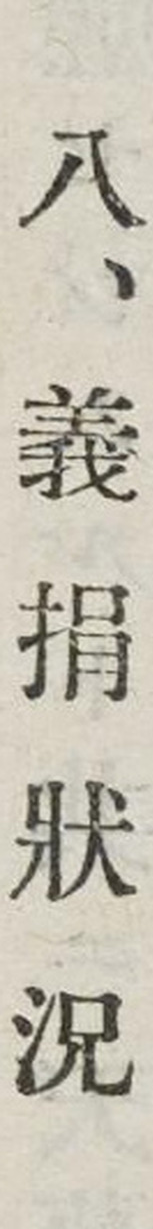八、義捐状況
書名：震災被害状況並救護施設概要
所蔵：東京大学地震研究所図書室 Earthquake Research Institute Library, The University of Tokyo, JAPAN
